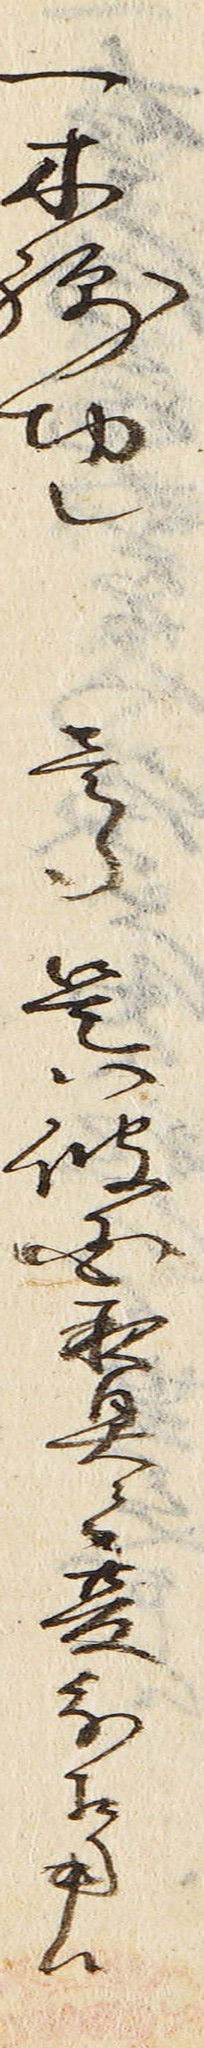一木綿切れ壱ツ是は彼国夜具に而夏分相用候
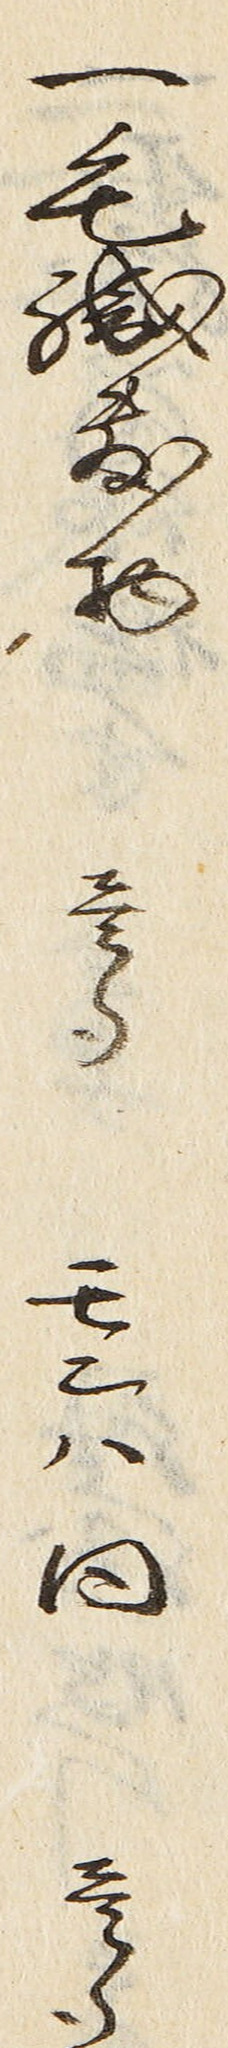一毛織敷物壱ツモンハ同壱ツ
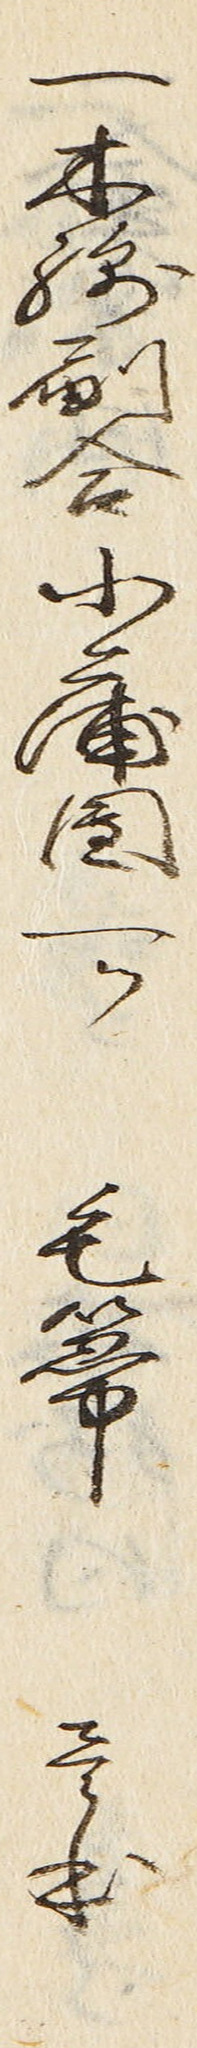一木綿刷合小蒲団一ツ毛箒壱本
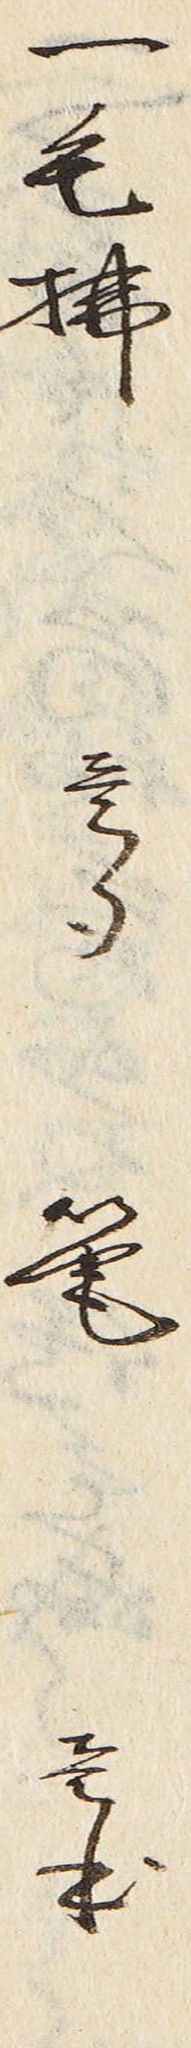一毛払壱ツ筆壱本
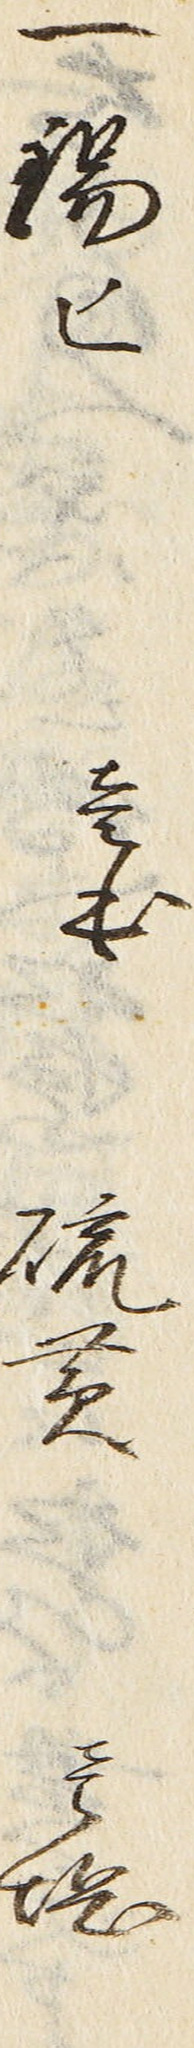一錫匕壱本硫黄壱塊
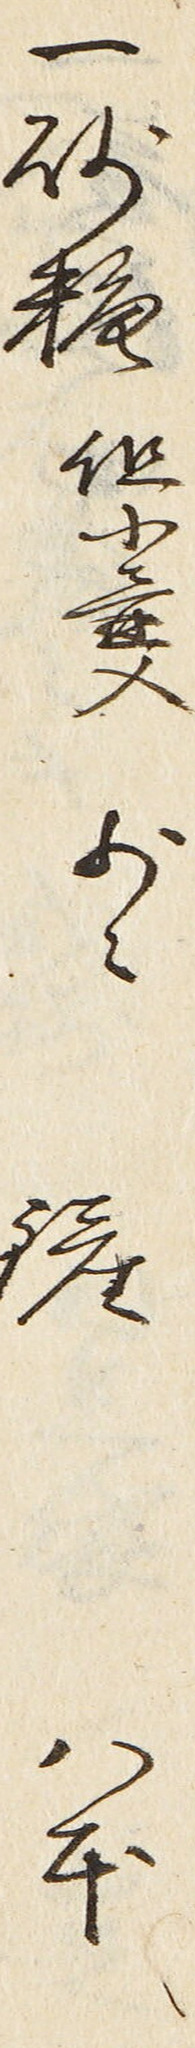一砂糖但小壺入少々鏟八本
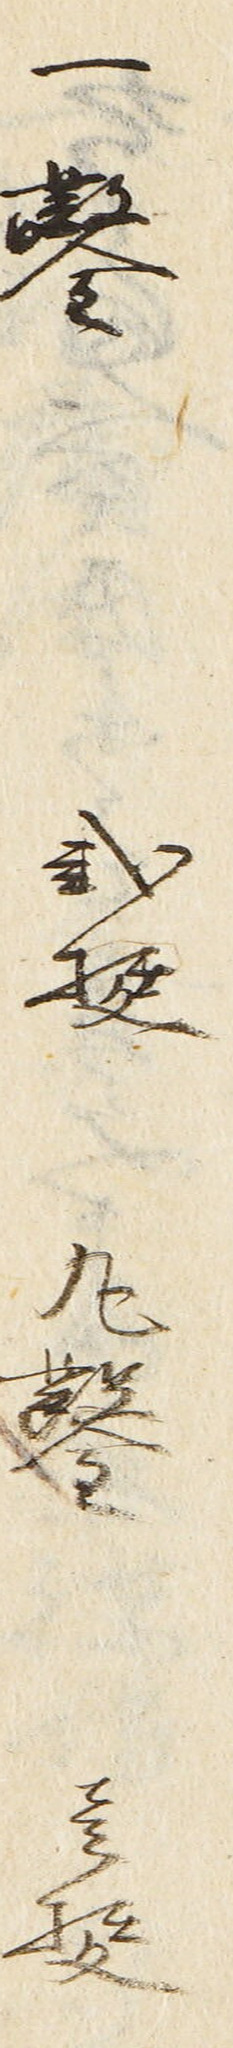一鑿弐挺丸鑿壱挺
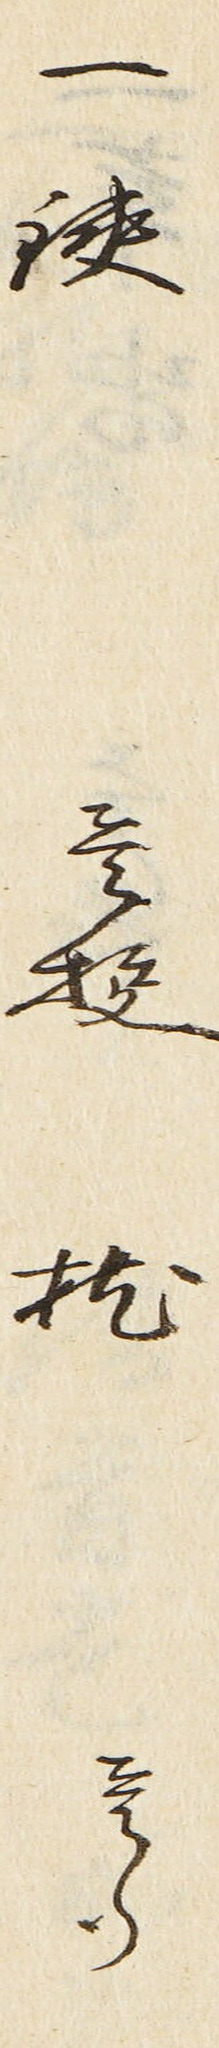一鋏壱挺枕壱ツ

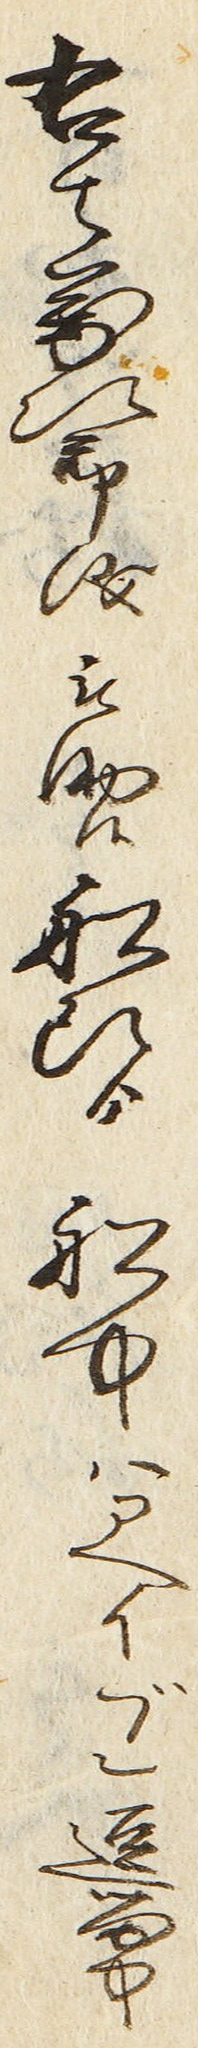右は万次郎儀被助候船頭ゟ船中ハアヘイブン逗留中
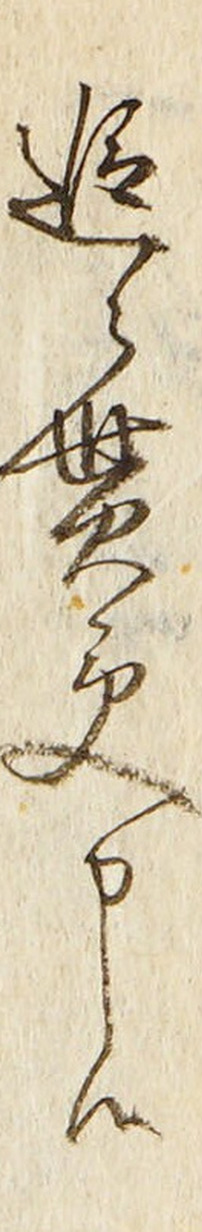追々貰受申候
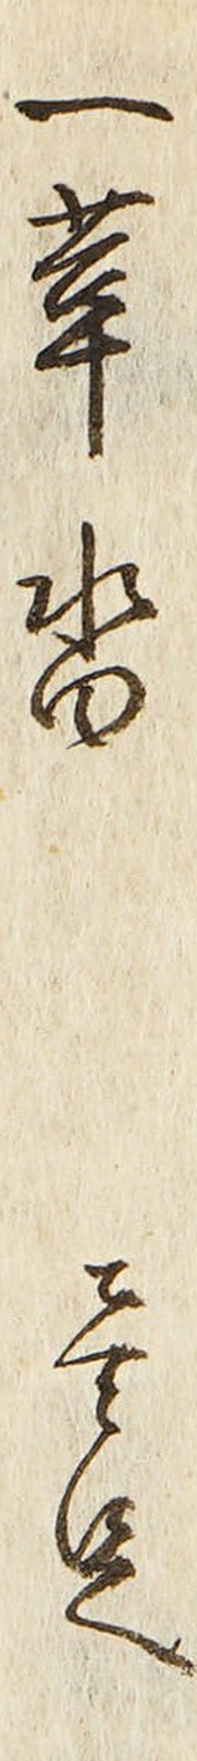一革沓壱足
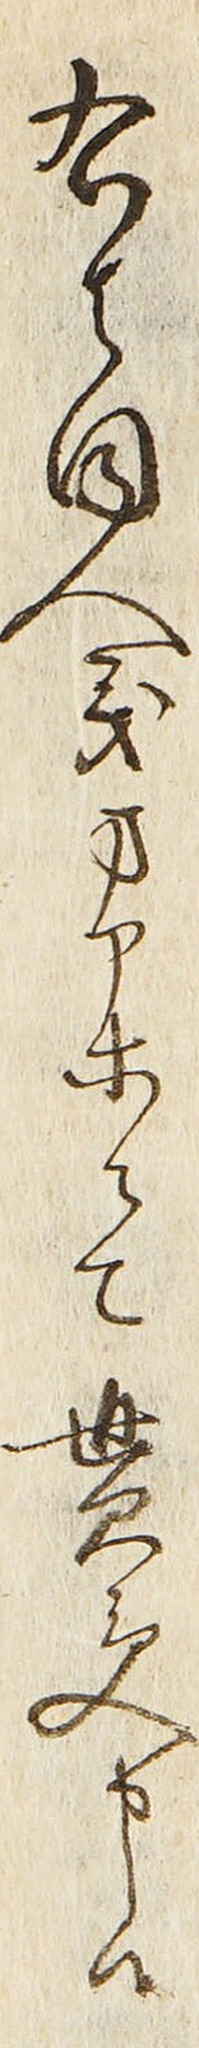右は同人義オアホにて貰受申候
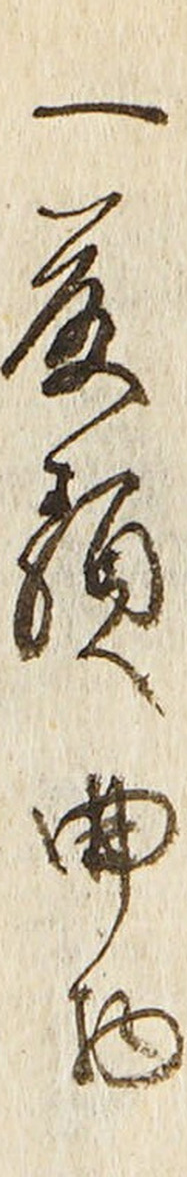一藤類曲物
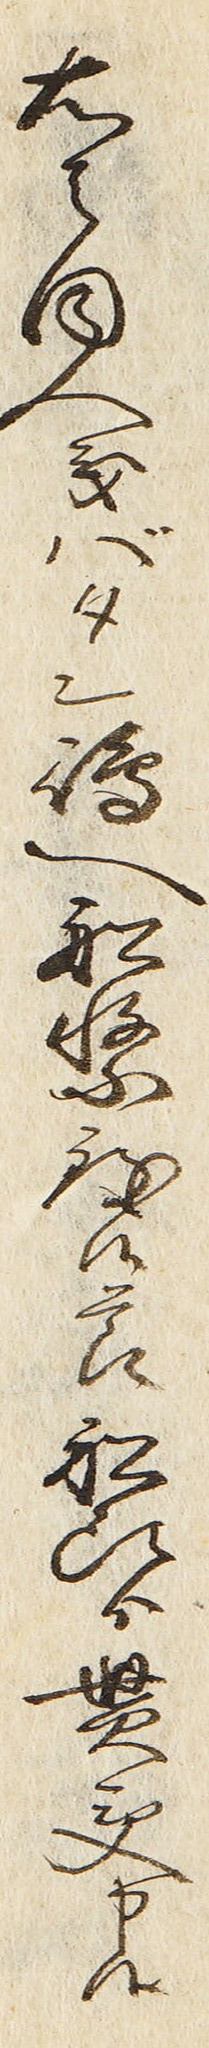右は同人義バタン嶋へ船繋致候節船頭ゟ貰受申候
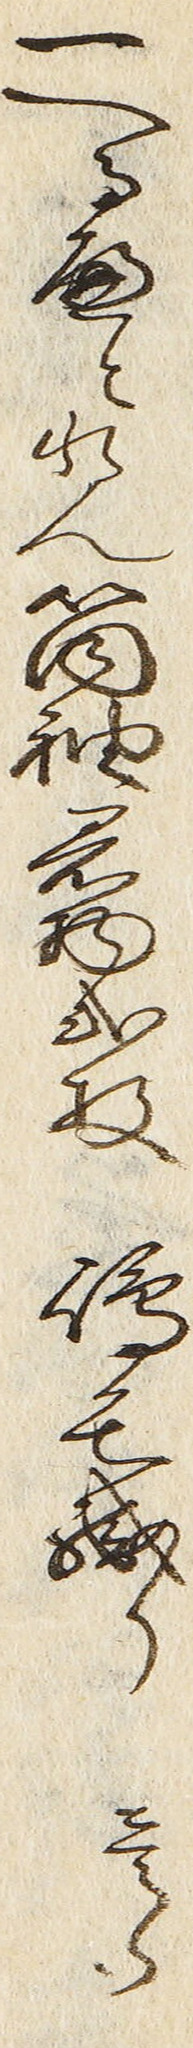一へるへとれん筒袖着物弐枚嶋毛織壱ツ
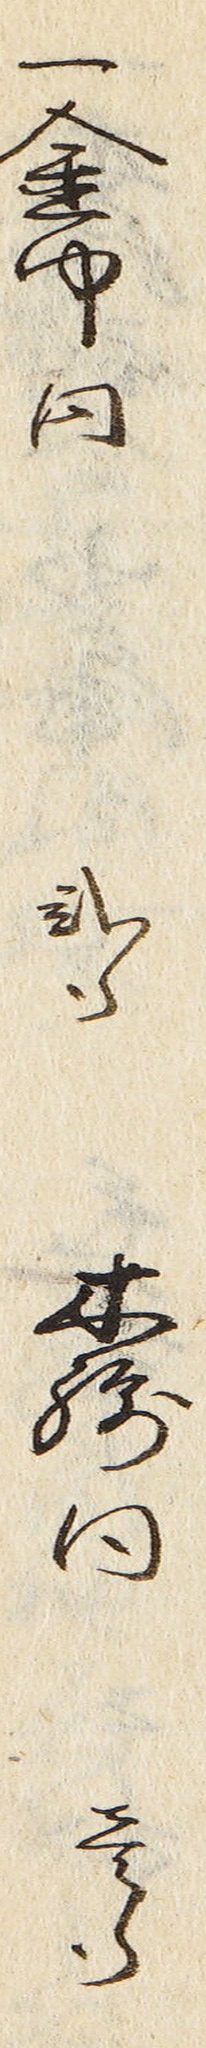一金巾同弐ツ木綿同壱ツ
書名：土佐中浜万次郎漂流記
